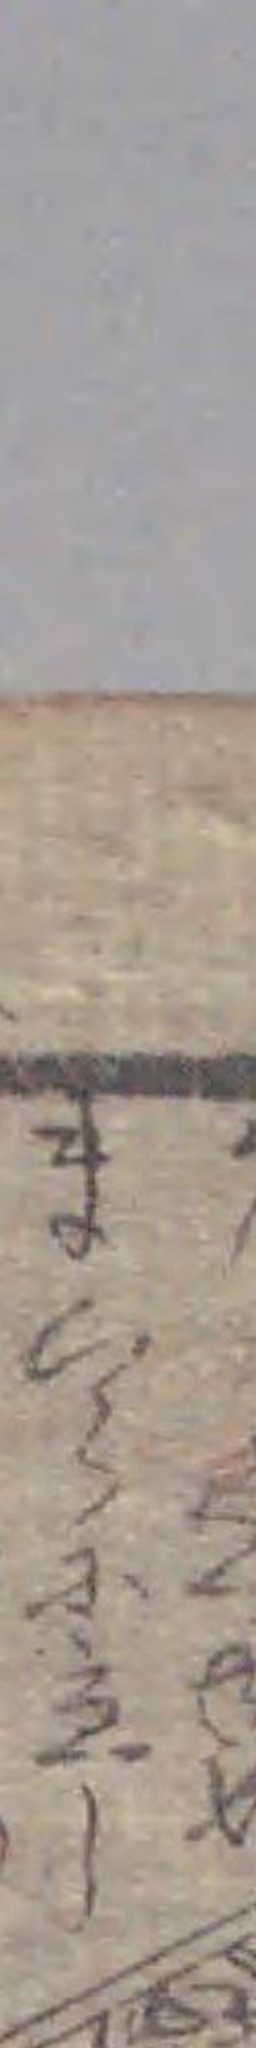まくらに立し
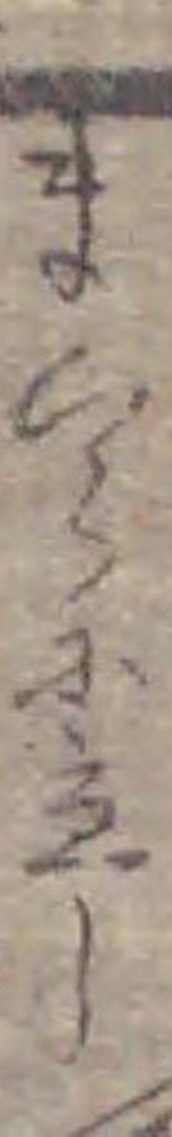まくらに立し
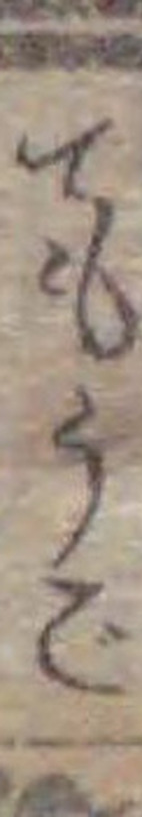てもうご
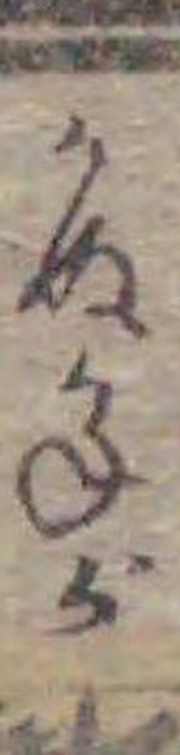かぬかねが
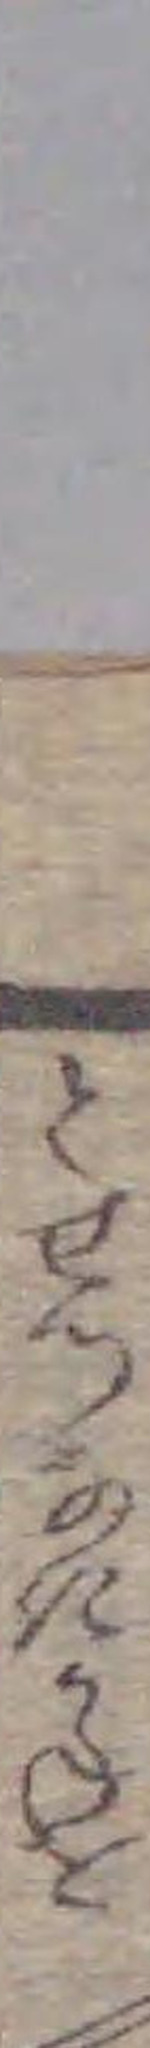とせつなきかねを
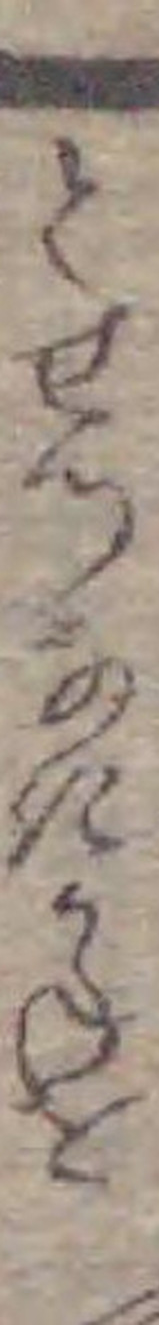とせつなきかねを
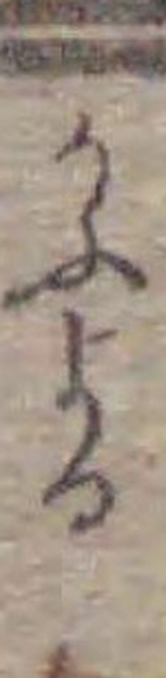かふよる
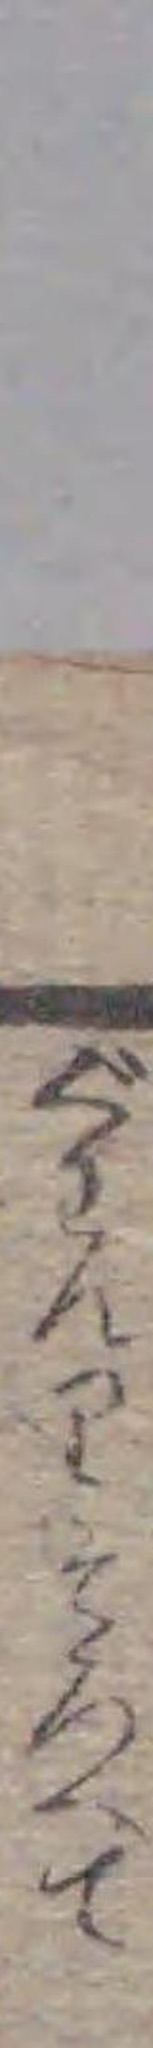ぐわんりそろへて
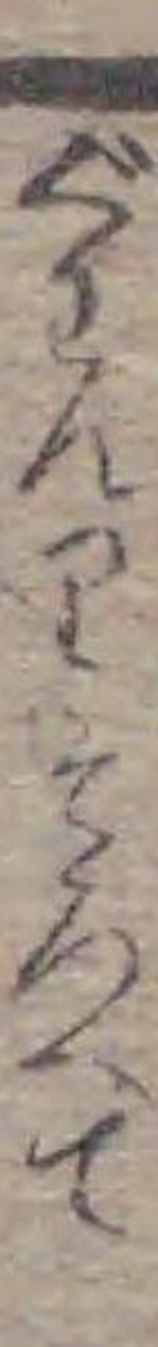ぐわんりそろへて
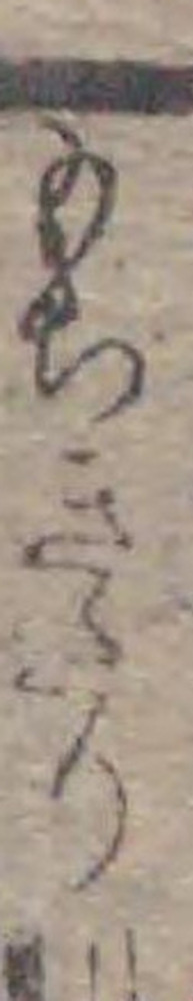もちきたり
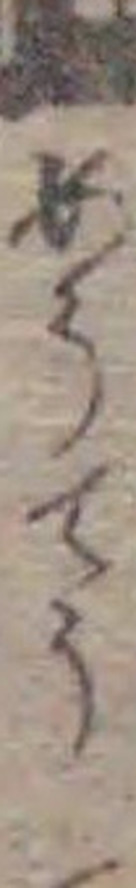めうてい
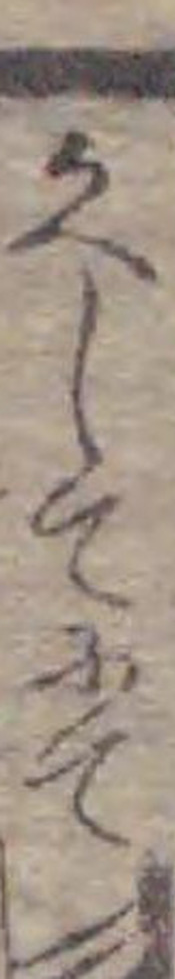かへしてにて
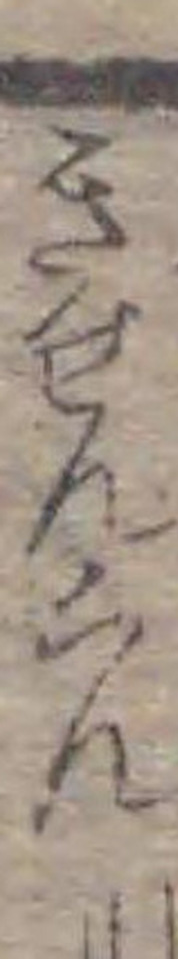きせんくん
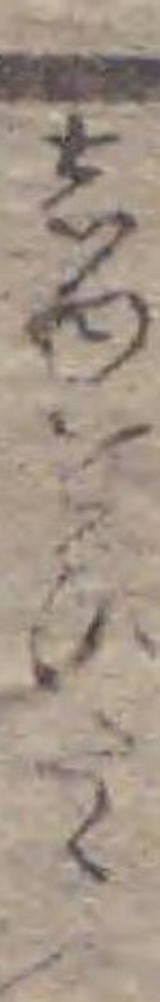しゆをひたゝ
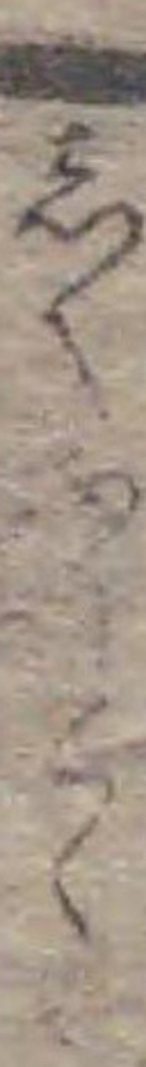しくふくとく
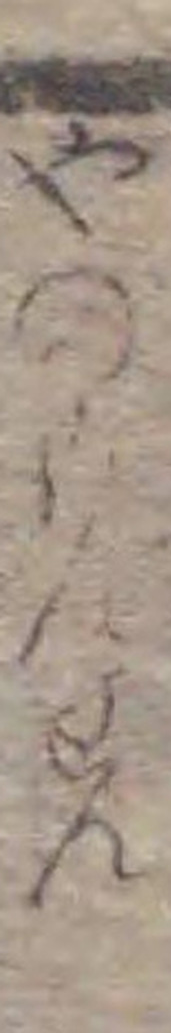やのもんせん
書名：紺屋百物語 : 3巻
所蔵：国立国会図書館 National Diet Library, JAPAN
